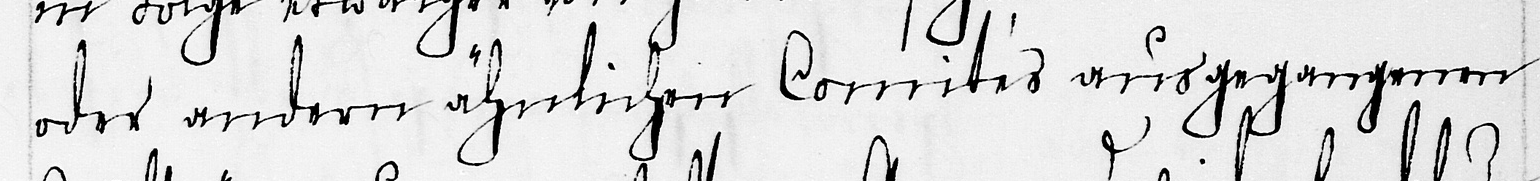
oder andern ähnlichen Comités ausgegangenen
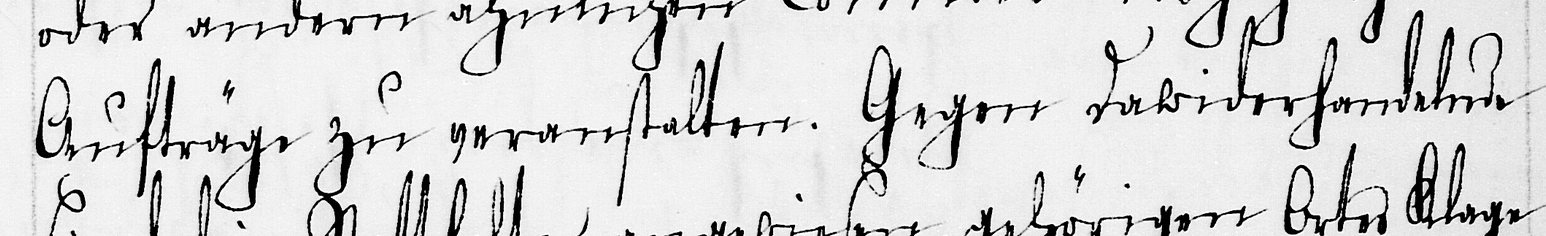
Aufträge zu veranstalten. Gegen Dawiderhandelnde
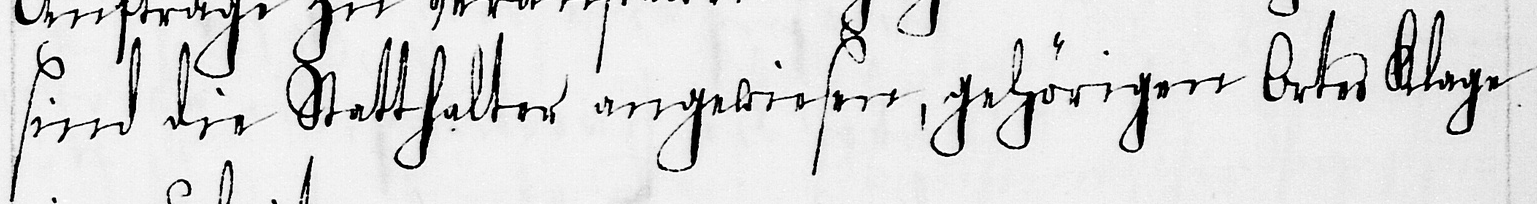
sind die Statthalter angewiesen, gehörigen Ortes Klage
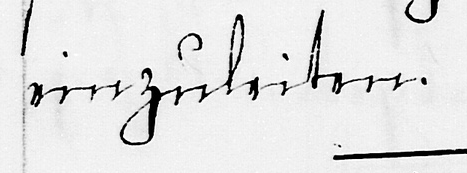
einzuleiten.
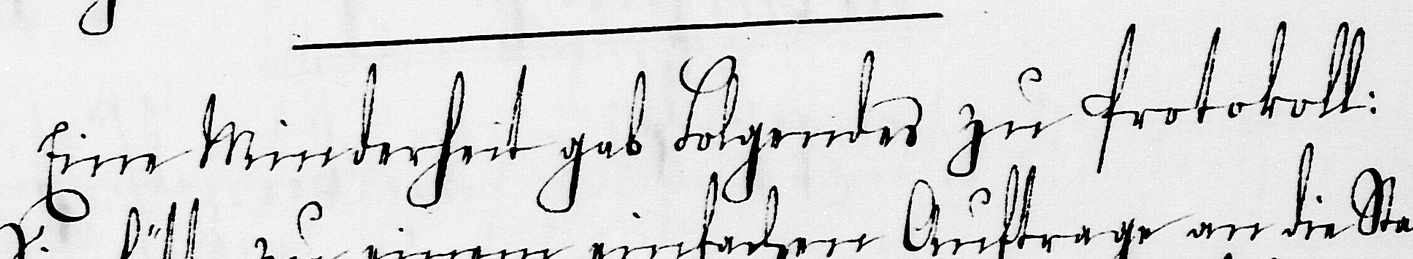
Eine Minderheit gab Folgendes zu Protokoll:
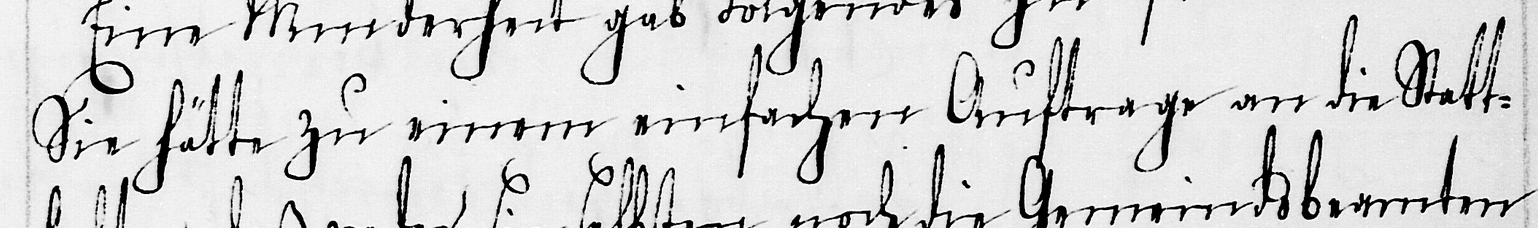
Sie hätte zu einem einfachen Auftrage an die Statt¬
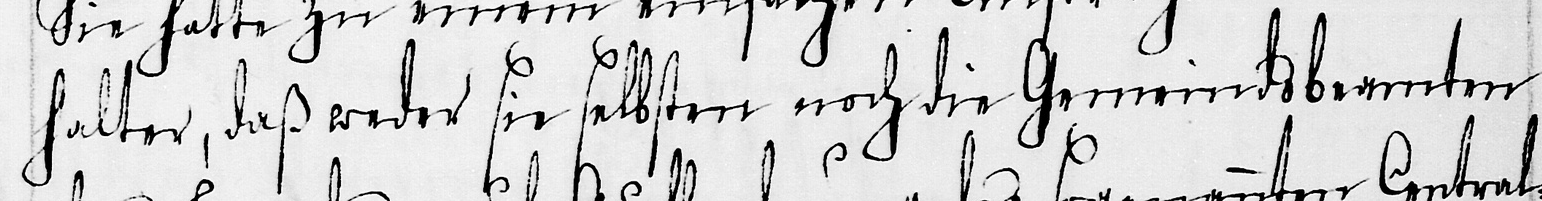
halter, daß weder sie selbsten noch die Gemeindsbeamten
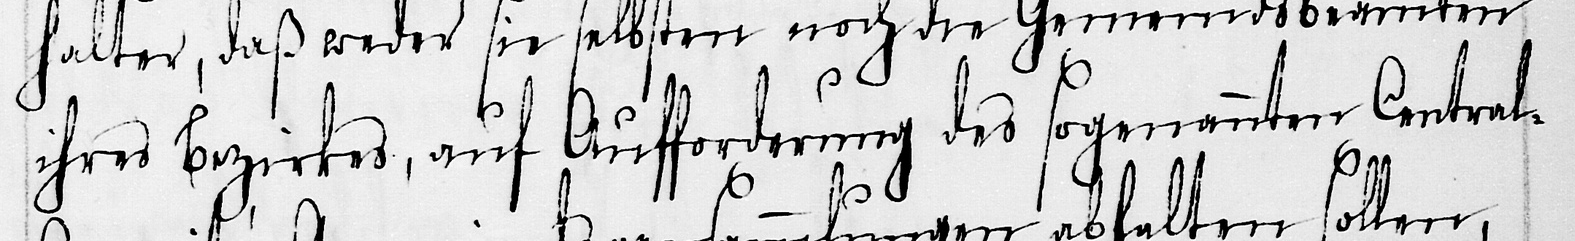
ihres Bezirkes, auf Aufforderung des sogenannten Centra¬
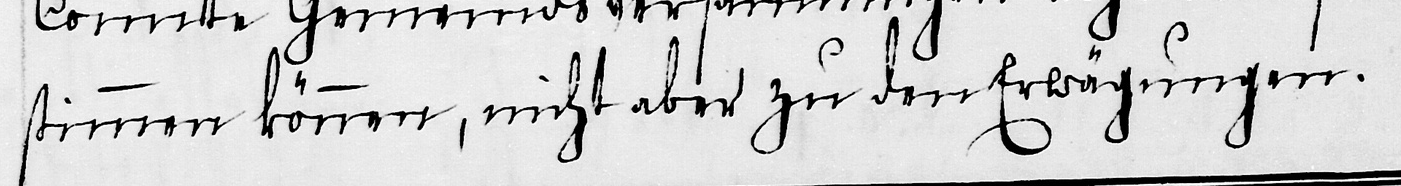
stimmen können, nicht aber zu den Erwägungen.
